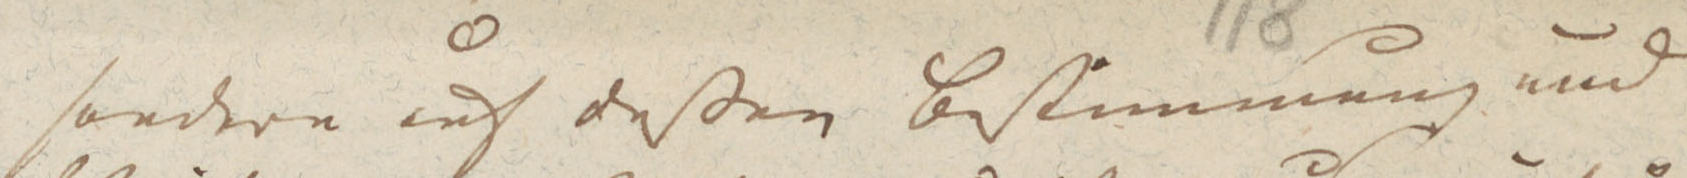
sondern auf dessen Bestimmung und
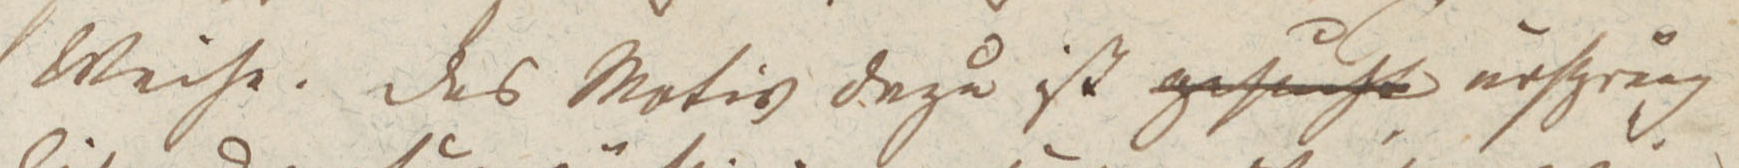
Weihe. Das Motiv dazu ist gesucht ursprüng
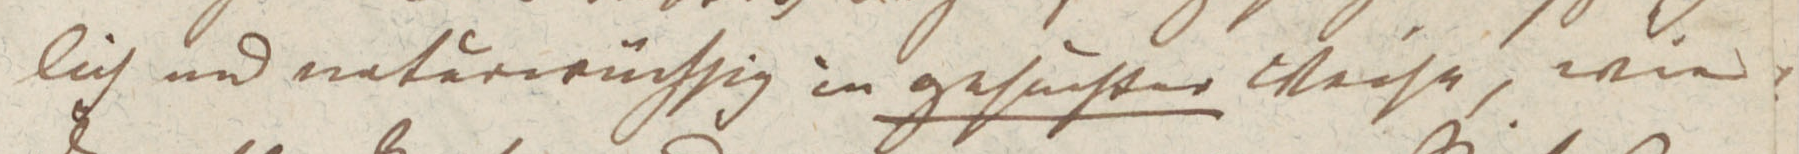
lich und naturwüchsig in gesuchter Weise, wie
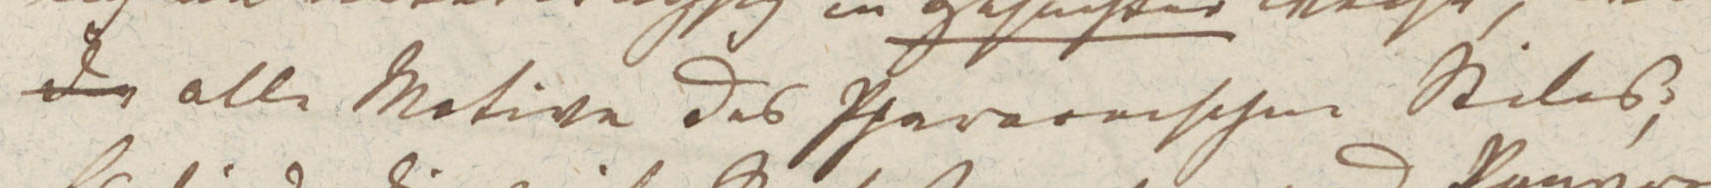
die alle Motive des Pharaonischen Stiles;
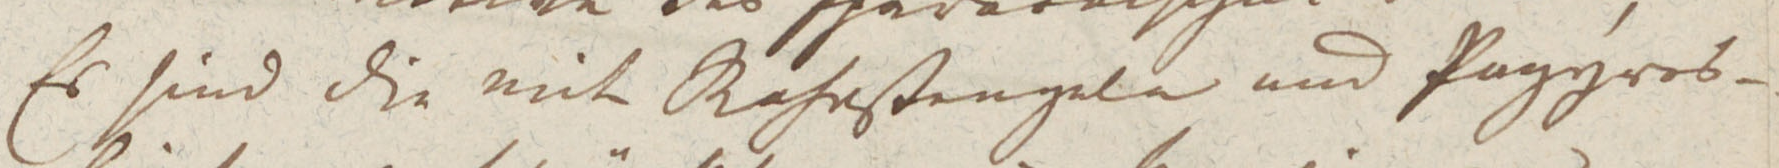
Es sind die mit Rohrstengeln und Papyros-
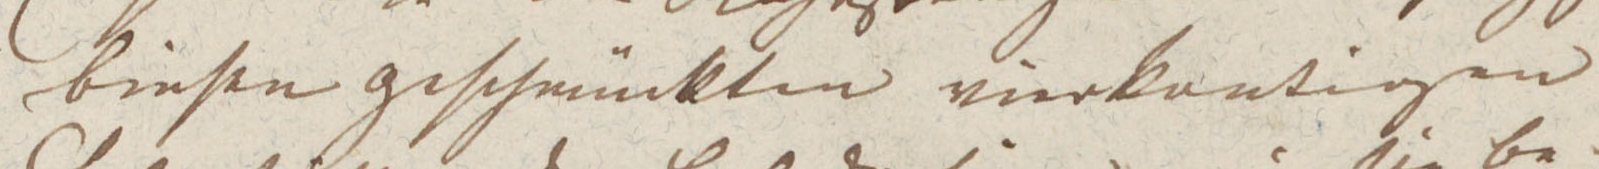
binsen geschmückten vierkantigen
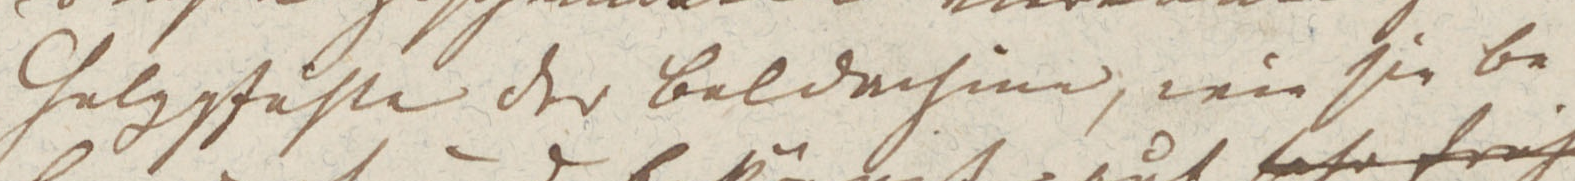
Holzpfähle der Baldachine, wie sie be-
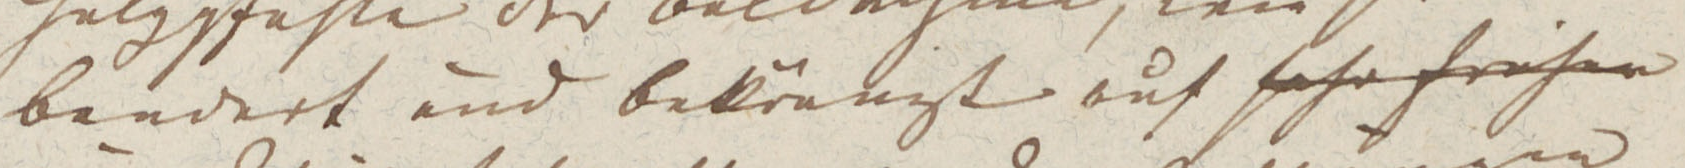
bandert und bekränzt auf sehr früher
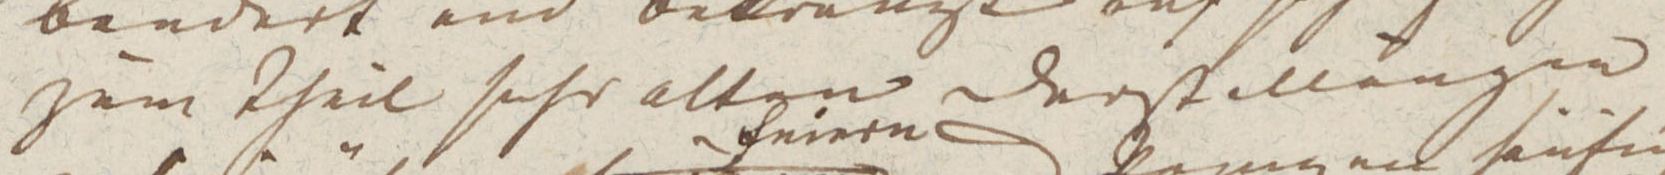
zum Theil sehr alten Darstellungen
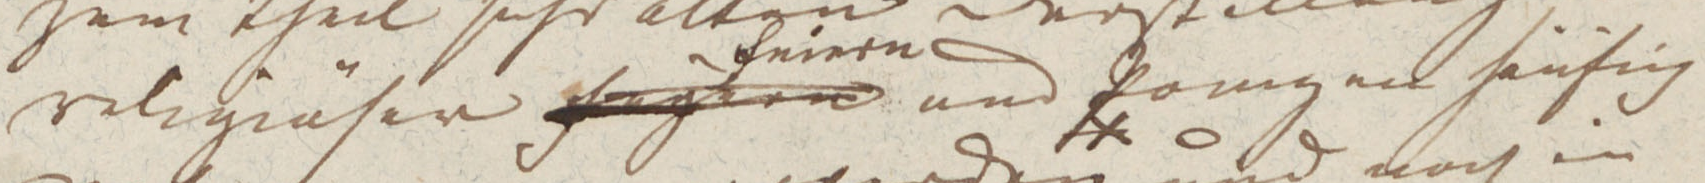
religiöser Fegern Feiern und Pompen häufig
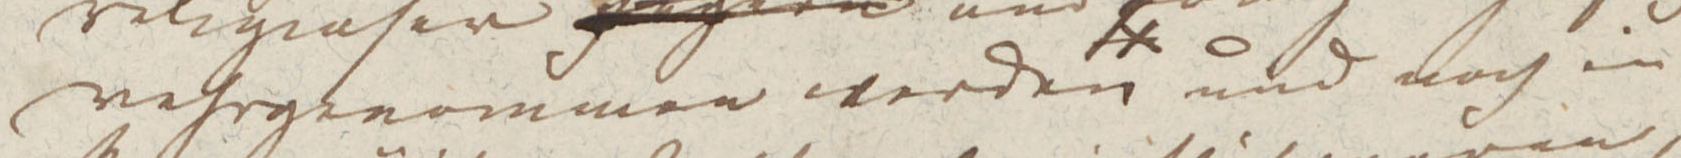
wahrgenommen werden % und noch in
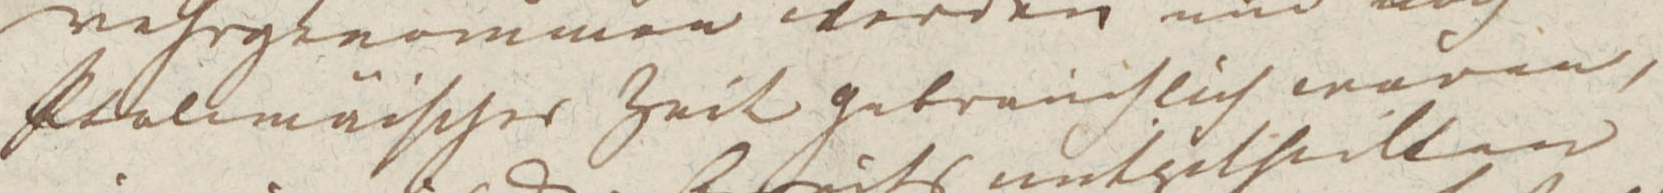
Ptolemäischer Zeit gebräuchlich waren,
